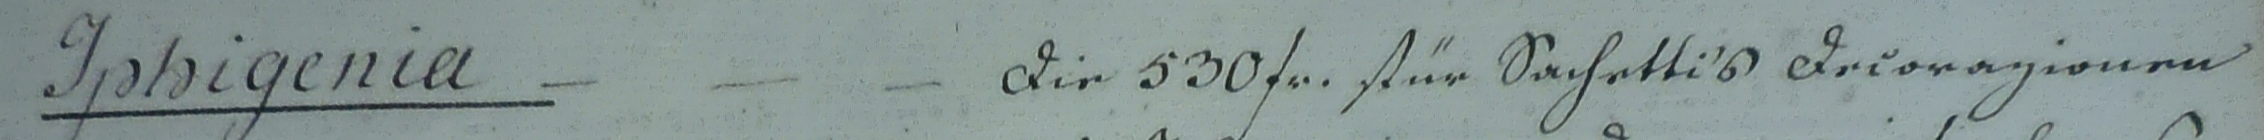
Iphigenia _ _ _ Die 530fr. für Sachetti‘s Decorazionen
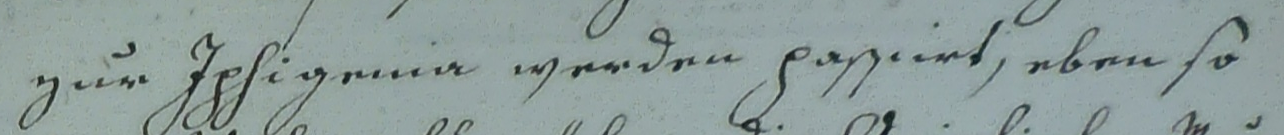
zur Iphigenia werden passirt, eben so
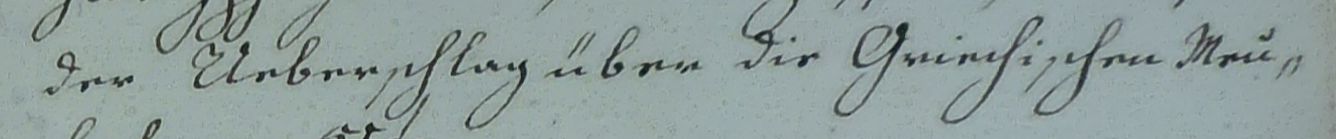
der Ueberschlag über die Griechischen Meu¬
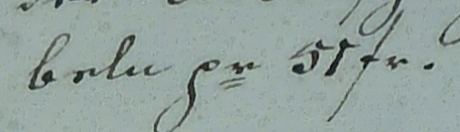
beln pr 51fr.
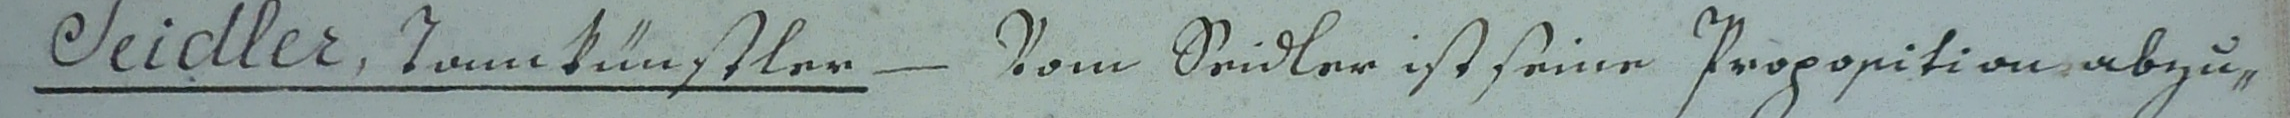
Seidler, Tonnkünstler __ Vom Seidler ist seine Proposition abzu¬
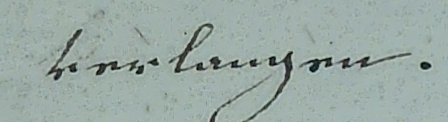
verlangen.
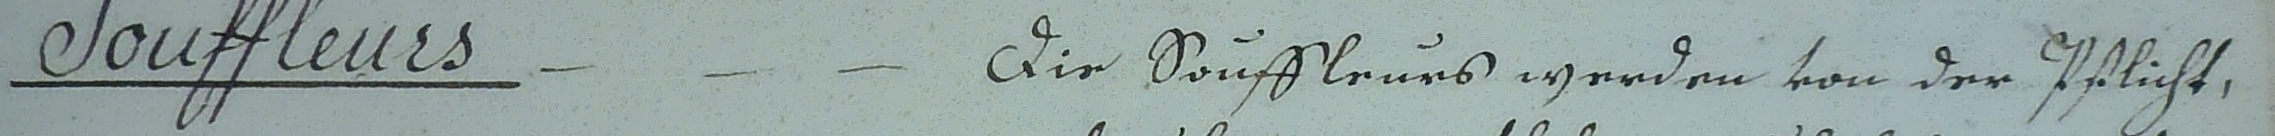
Souffleurs _ _ _ Die Souffleurs werden von der Pflicht,
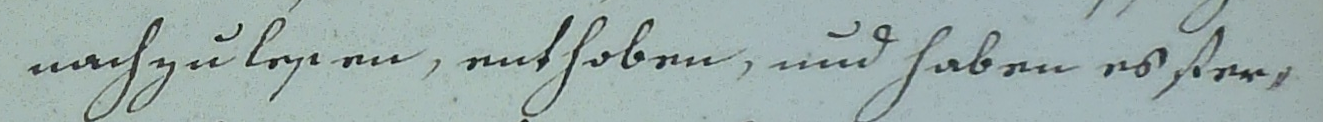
nachzulesen, enthoben, und haben es fer¬
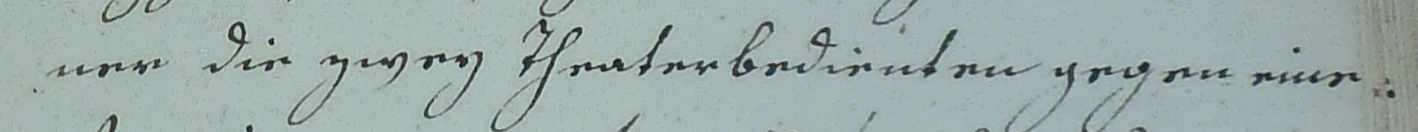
ner die zwey Theaterbedienten gegen eine
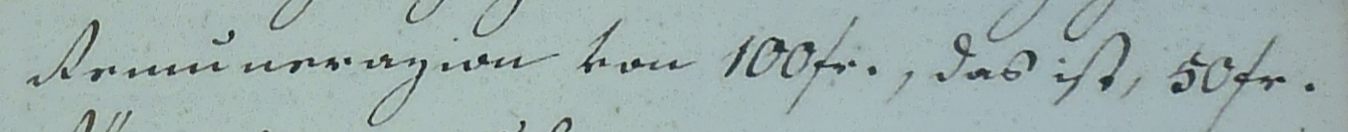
Remunerazion von 100fr., das ist, 50fr.
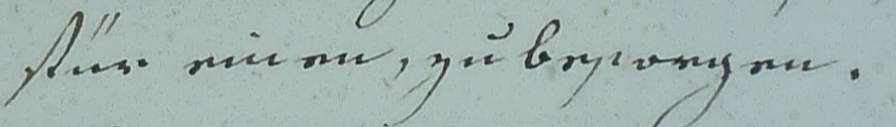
für einen, zubesorgen.
